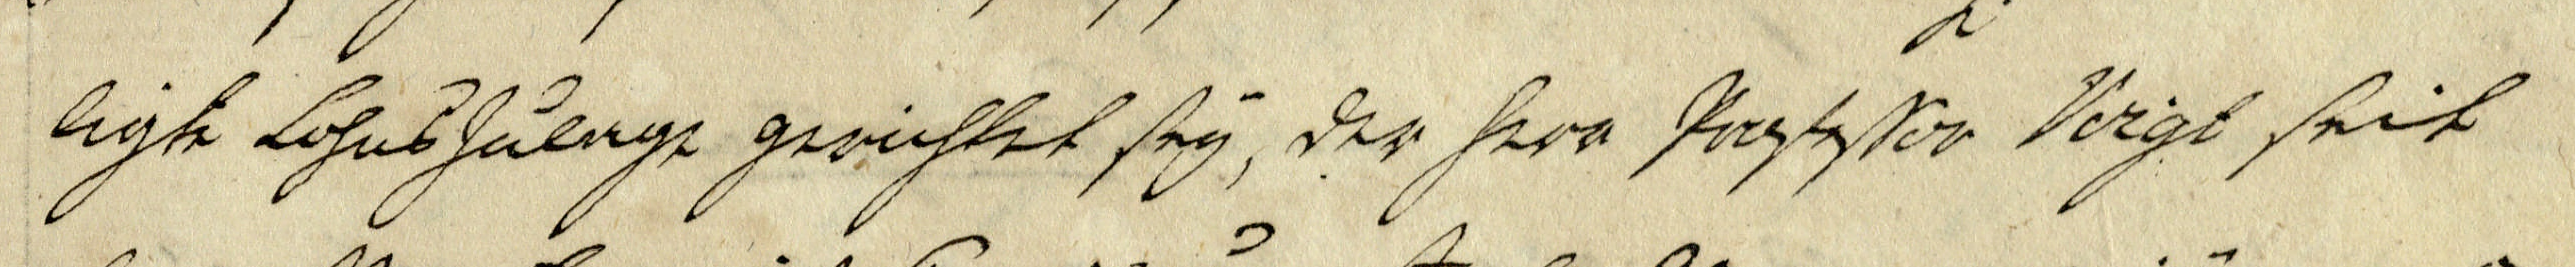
ligte Lohnszulage gerichtet seÿ, der Herr Professor Voigt seit
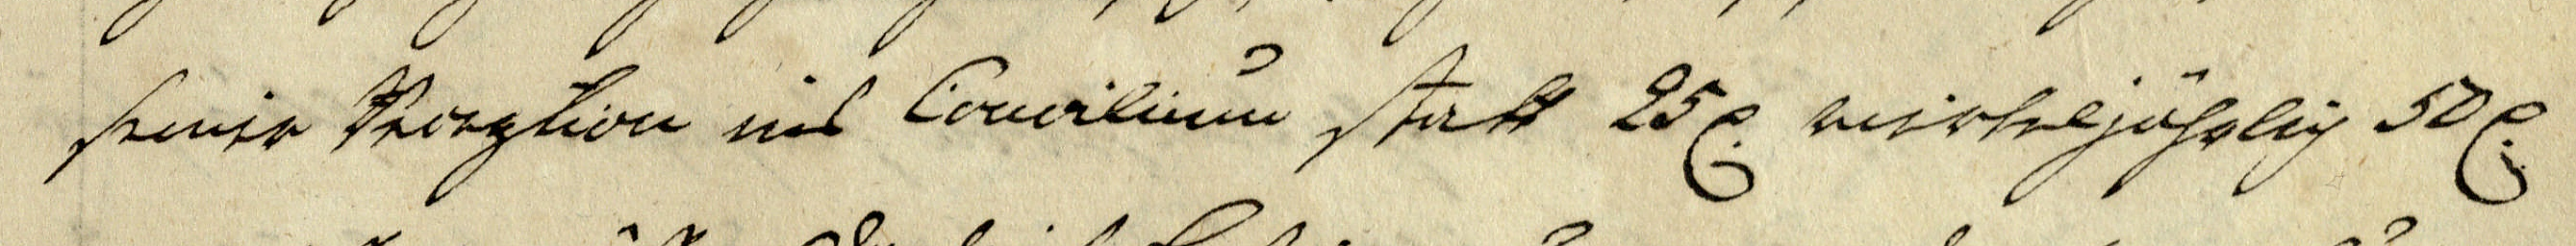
seiner Reception ins Concilium statt 25 l. vierteljährlich 50 l.
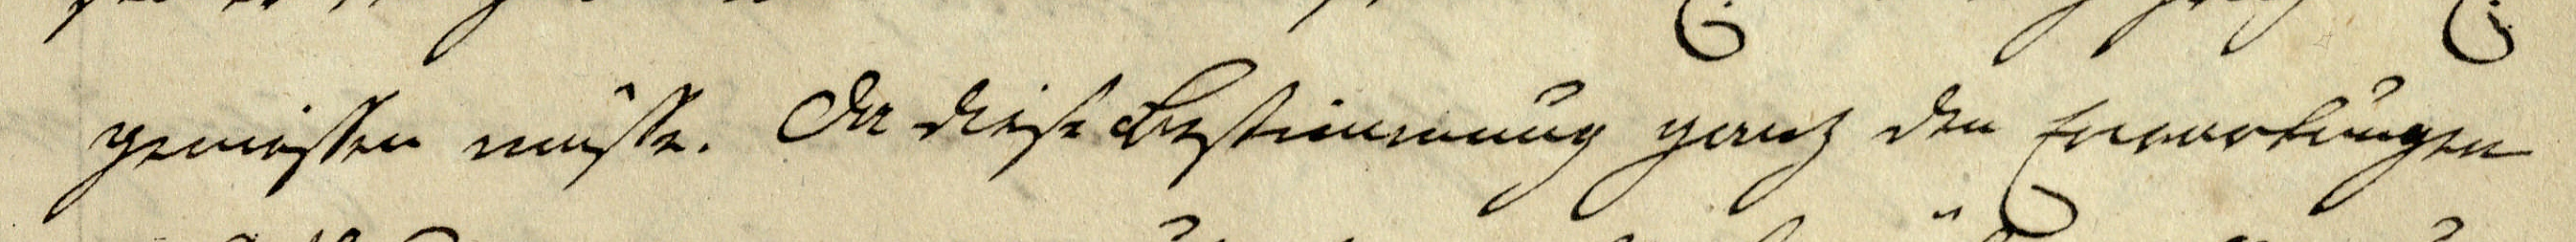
geniessen müsse. Da diese Bestimmung ganz den Erwartungen
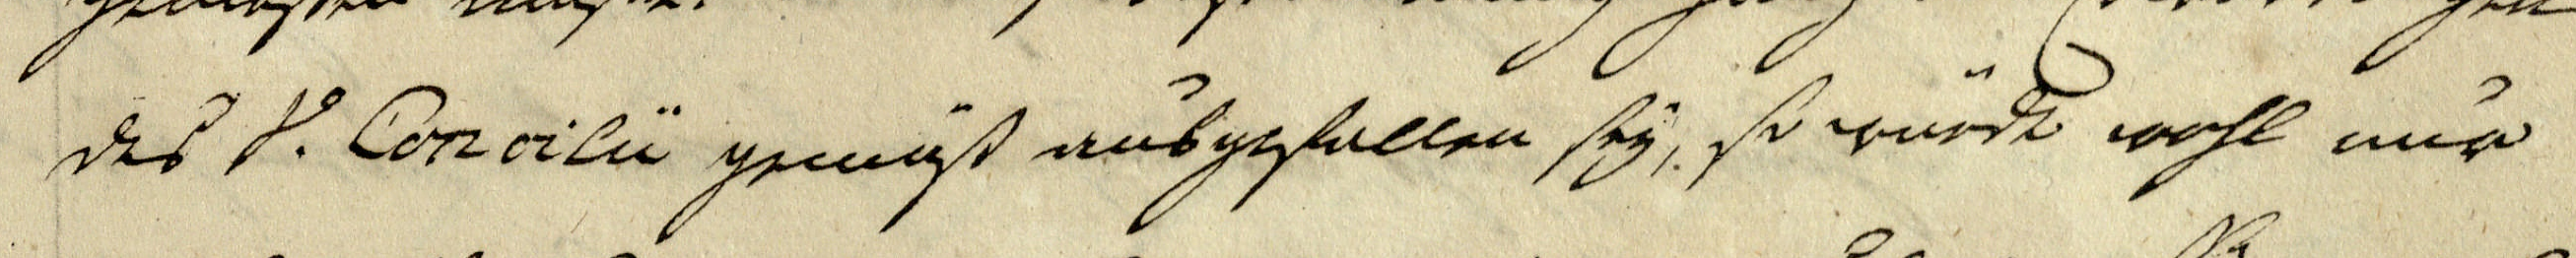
des V. Concilii gemäß ausgefallen seÿ, so würde wohl nur
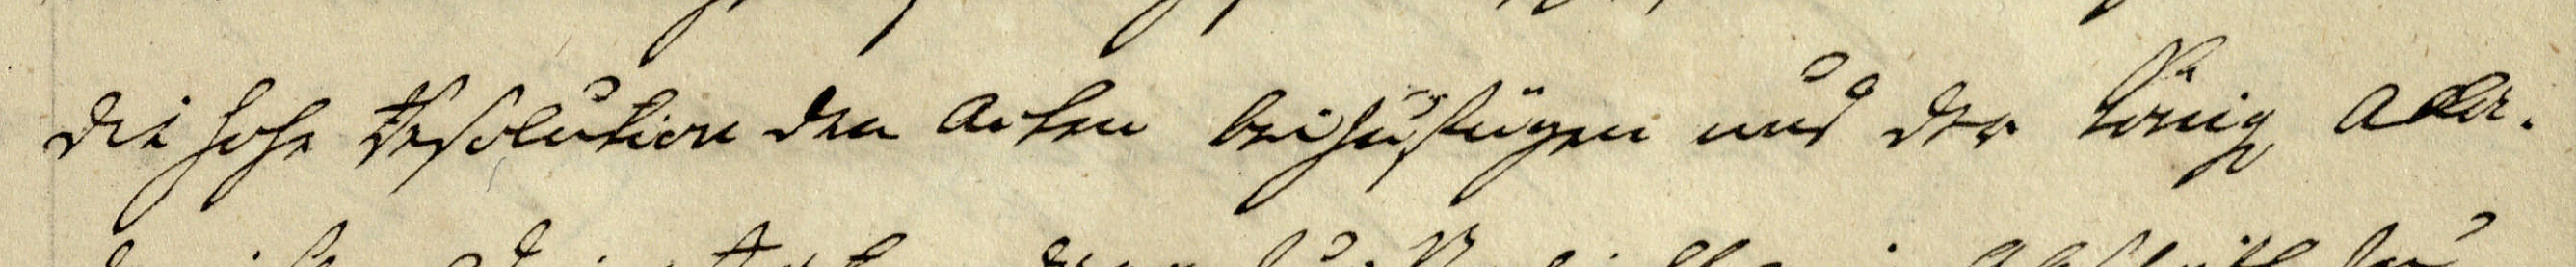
die hohe Resolution den Acten beizufügen und der König. Aka¬
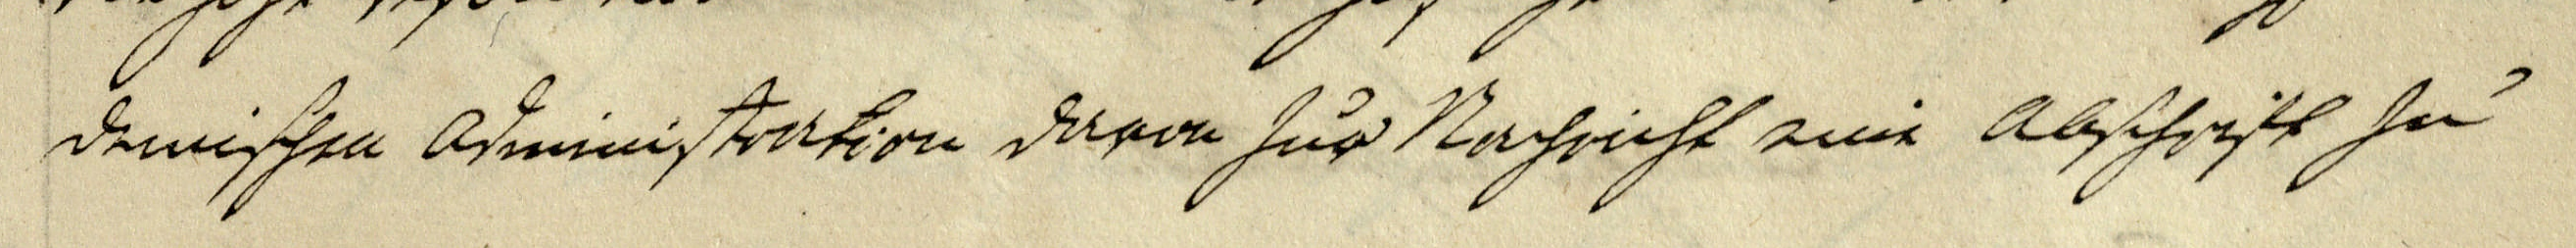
demischen Administration davon zur Nachricht eine Abschrift zu
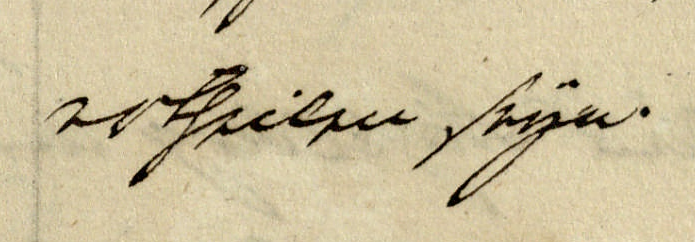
ertheilen seÿn.
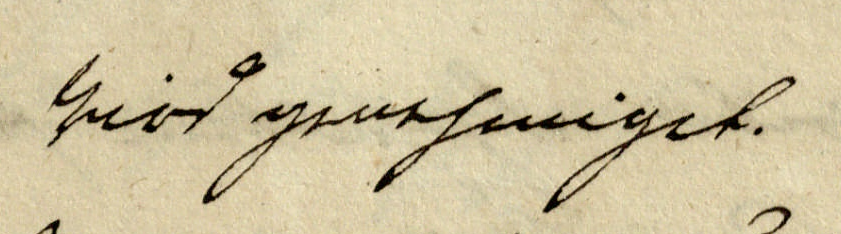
Wird genehmiget.
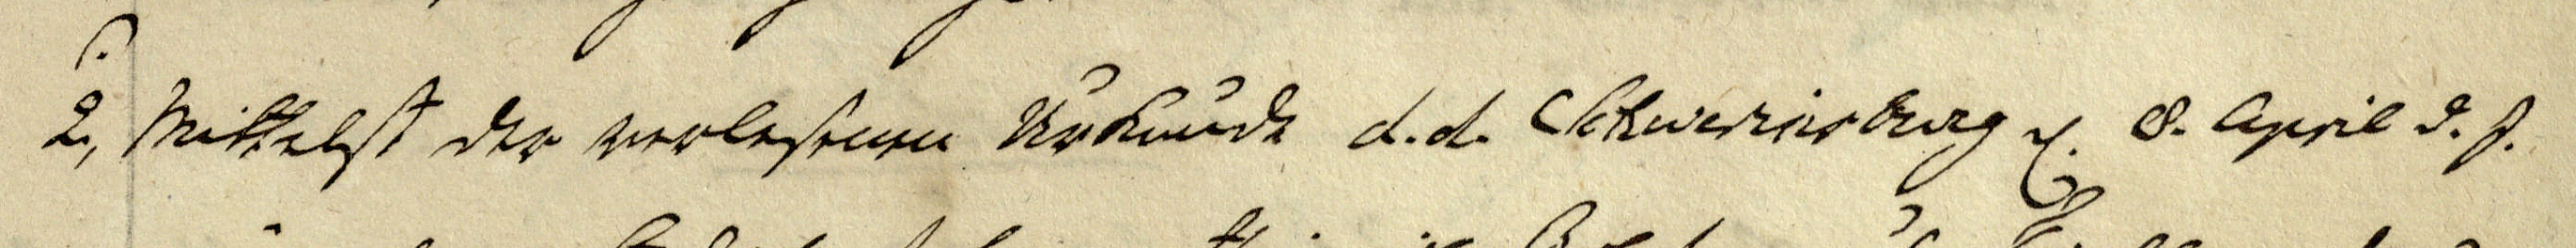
2, Mittelst der verlesenen Urkunde d. d. Schewerinsburg d. 8. April d. J.
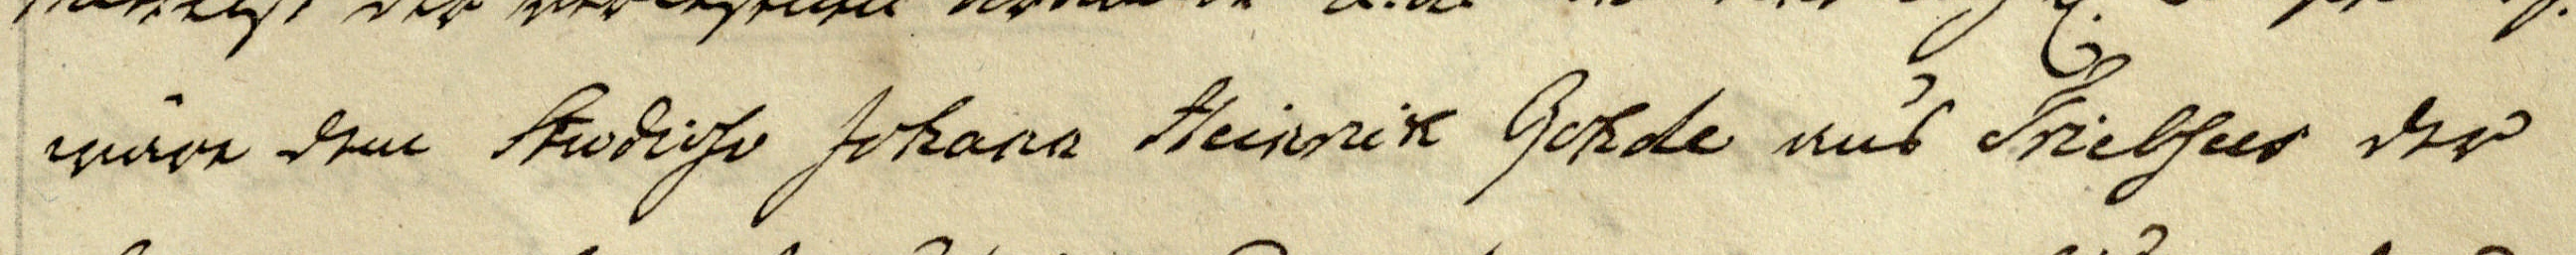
wäre dem Studioso Johann Heinrich Rohde aus Triebsees der
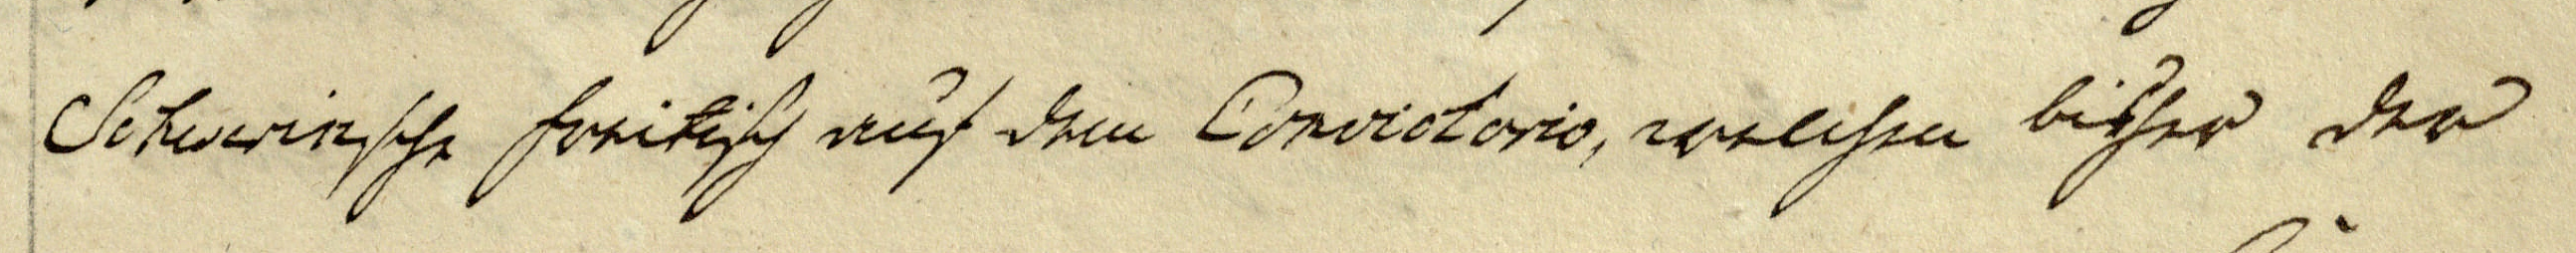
Schwerinsche Freitisch auf dem Convictorio, welchen bisher der
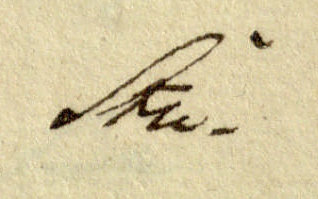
Stu.
